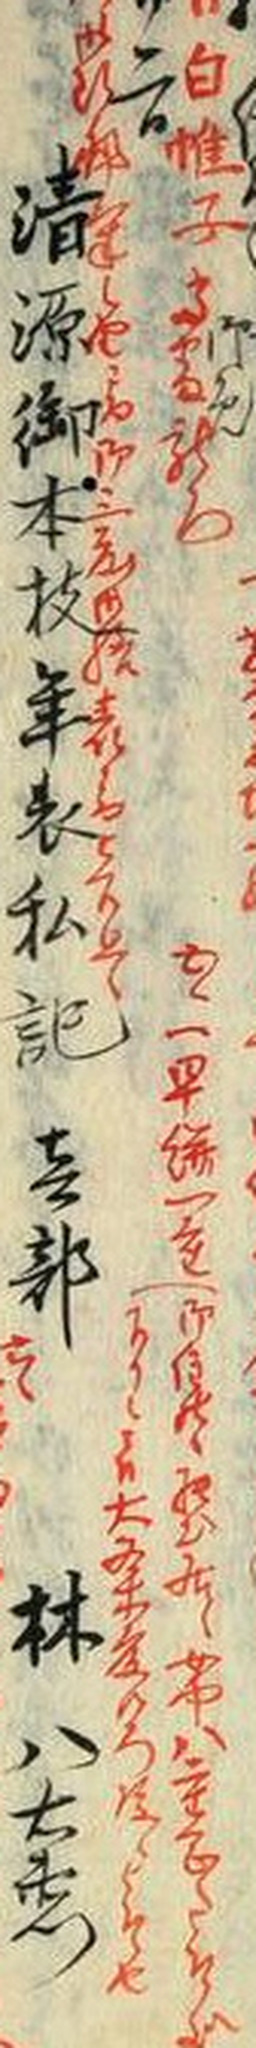清源御本枝年表私記壱部林八右衛門
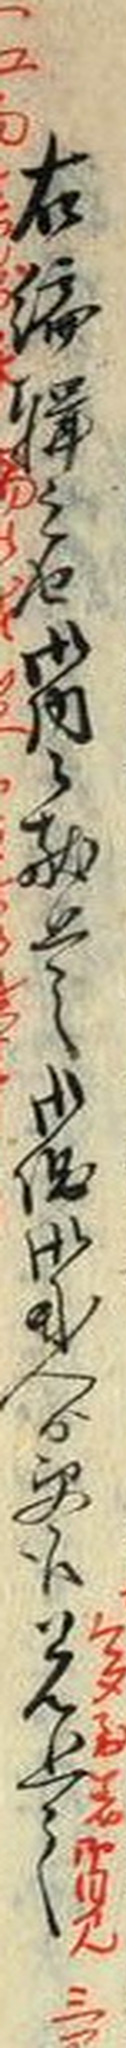右編輯之由御内々献上之御側御用人ゟ受取差上之
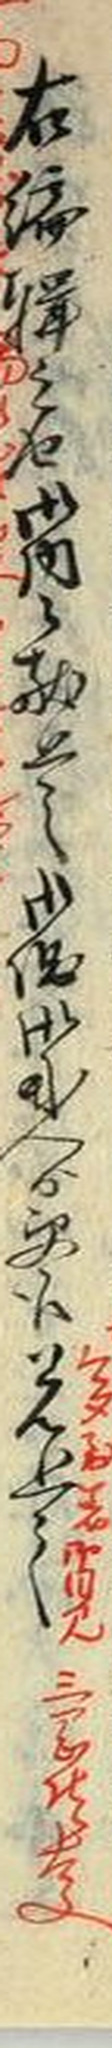右編輯之由御内々献上之御側御用人ゟ受取差上之
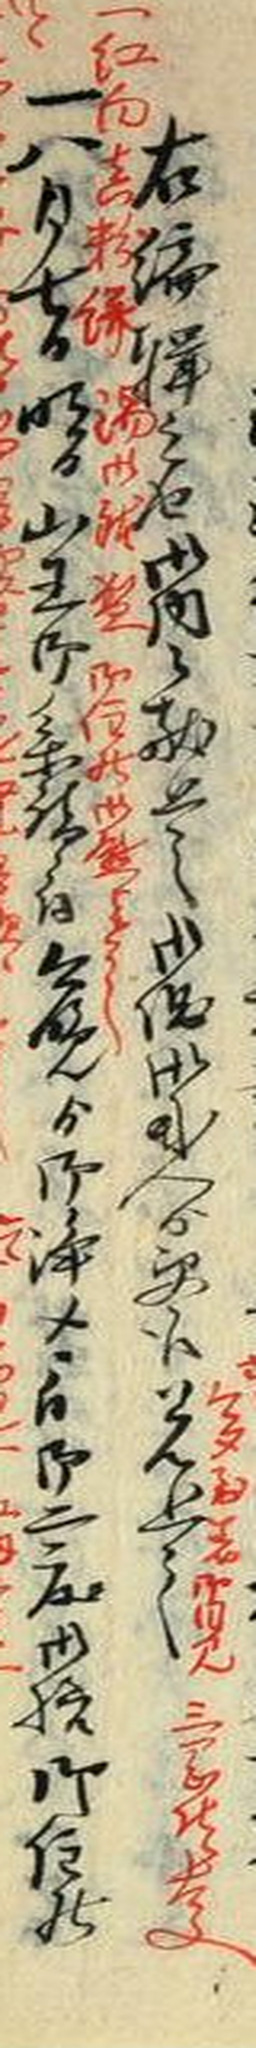一八月七日明日山王御参詣ニ付今晩ゟ御浄メニ付御二度御膳御住居
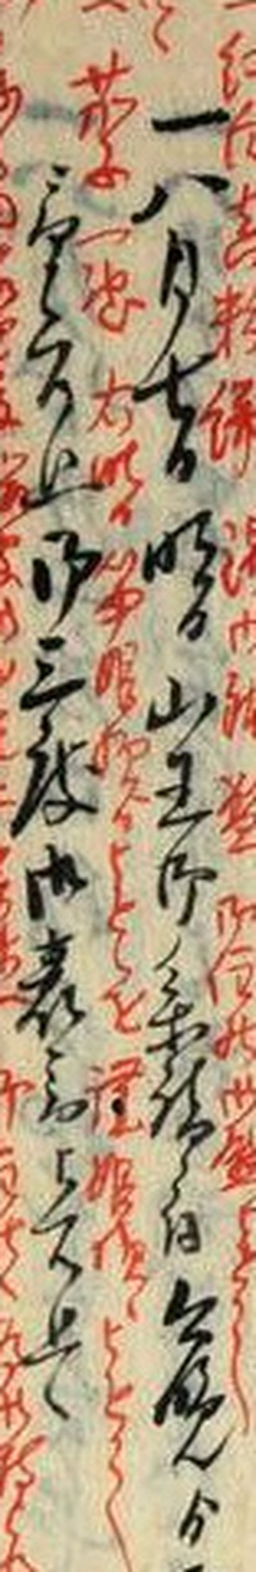ニ而被召上御三度御表ニ而被召上候

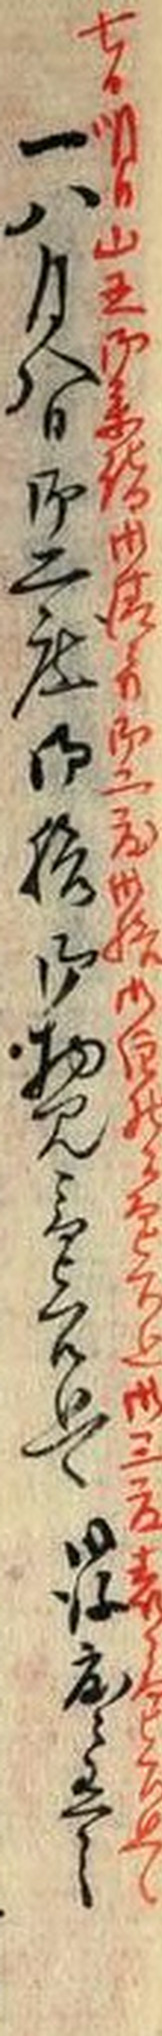一八月八日御二度御膳御物見ニ而被召上候以後度々有之
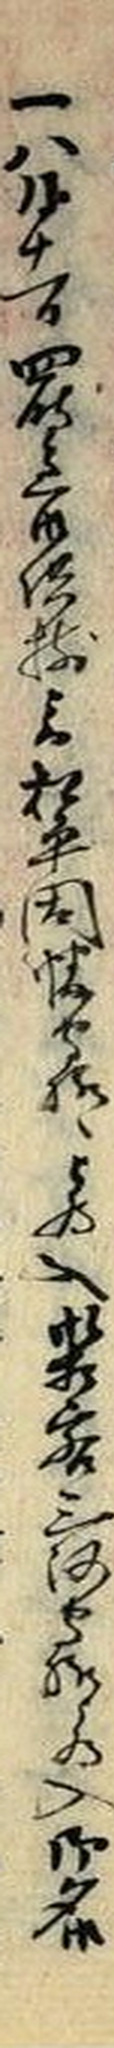一八月十一日四時過御供揃ニ而松平因幡守様へ被為入御相客三河守様被為入御夕御
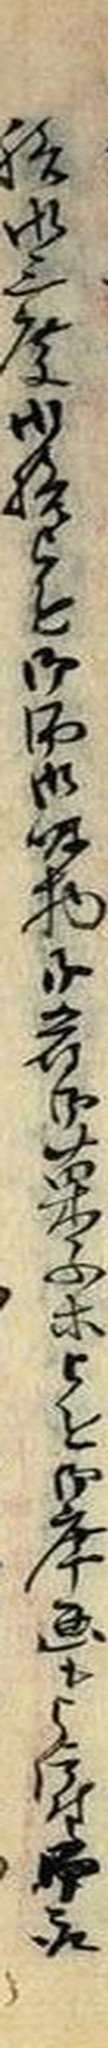膳御三度御膳被進御酒御吸物御肴御菓子等被進御席画も被仰付御取
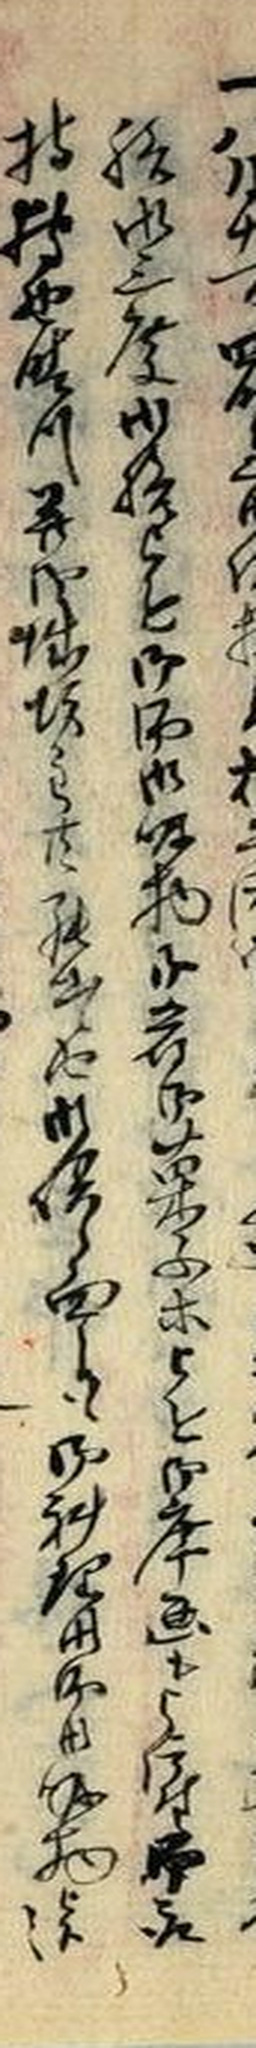持狩野晴川并御城坊主共罷出候由御供之面々も御料理御酒御吸物被下之
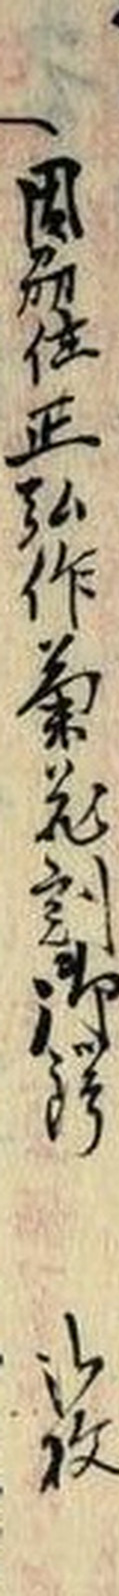因州住正弘菊花刻御鍔弐枚
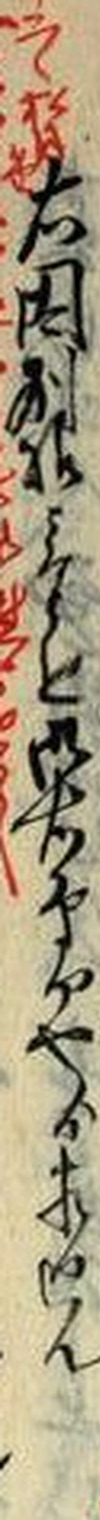右因州様ニ而被進御右筆部やゟ相廻ㇽ
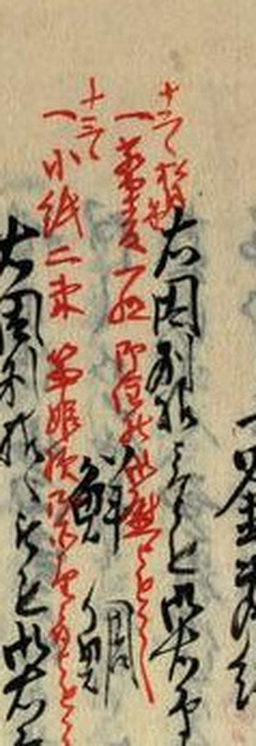一蕎麦一組御住居御慰被進之
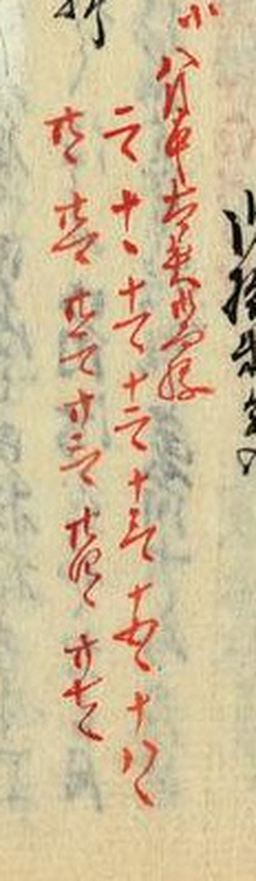二日十日十一日十二日十三日十五日十八日
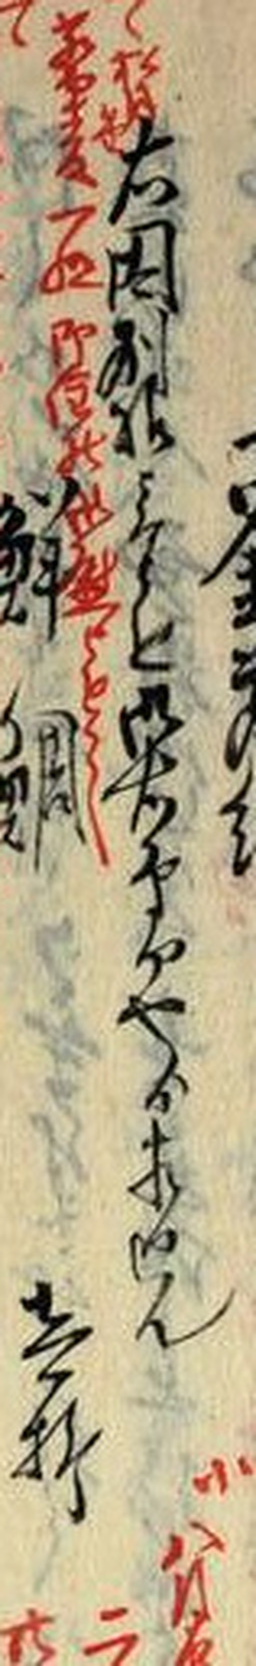鮮鯛壱折
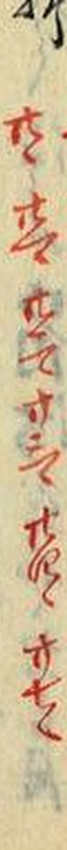廿日廿一日廿二日廿三日廿四日廿七日
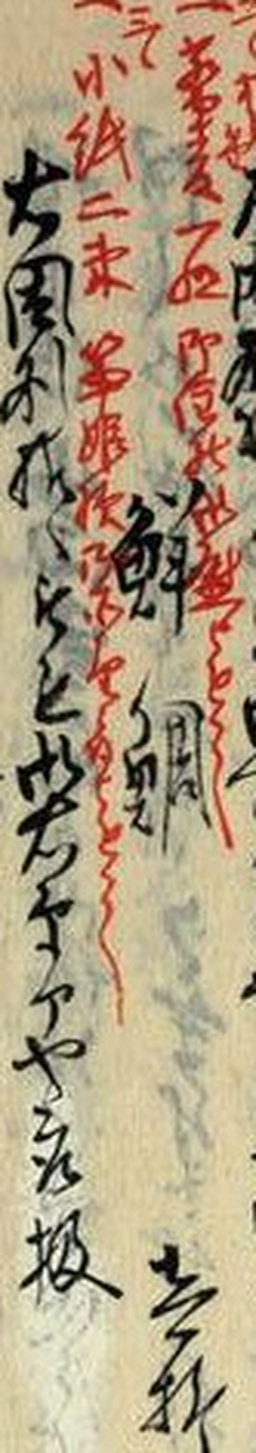右因州様へ被進御右筆部や取扱
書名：少傅日録抄（斉承付側向頭取日記、在府）
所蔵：福井県文書館 Fukui Prefectural Archives
